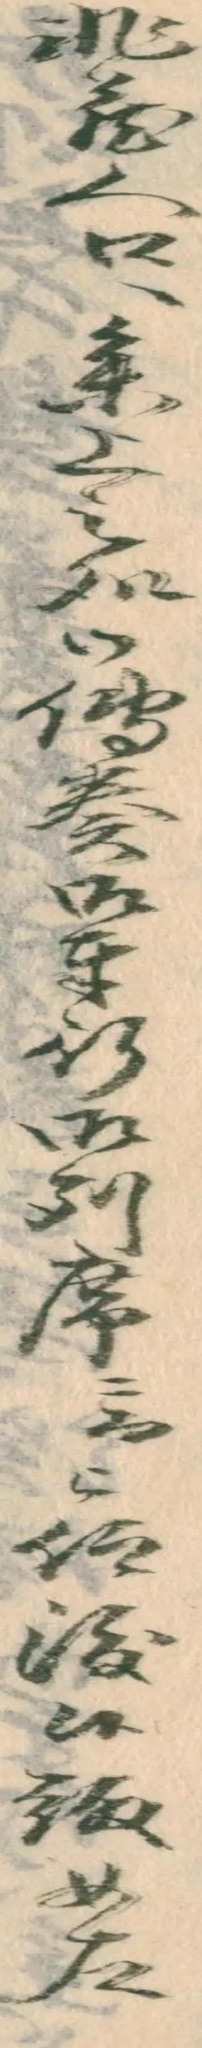非蔵人口へ参上之処御伝奏御奉行御列席ニ而被仰渡候趣如左
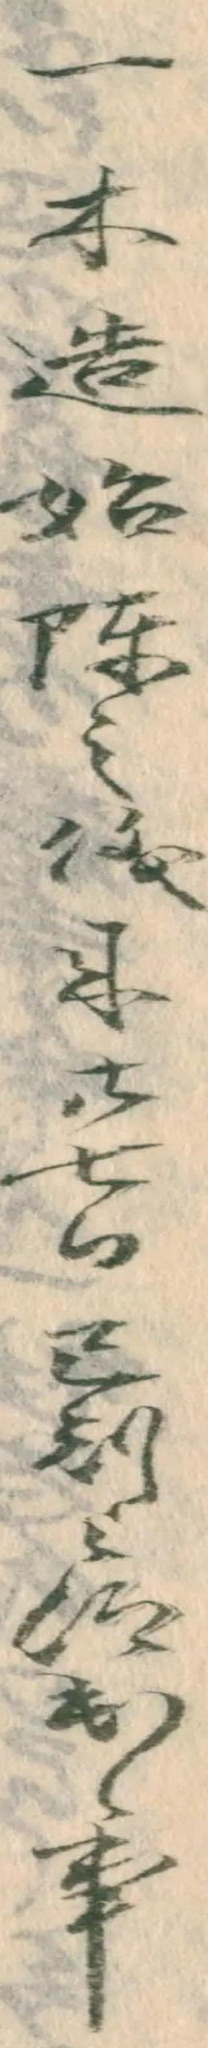一木造始陣之儀来廿七日巳刻被仰出候事
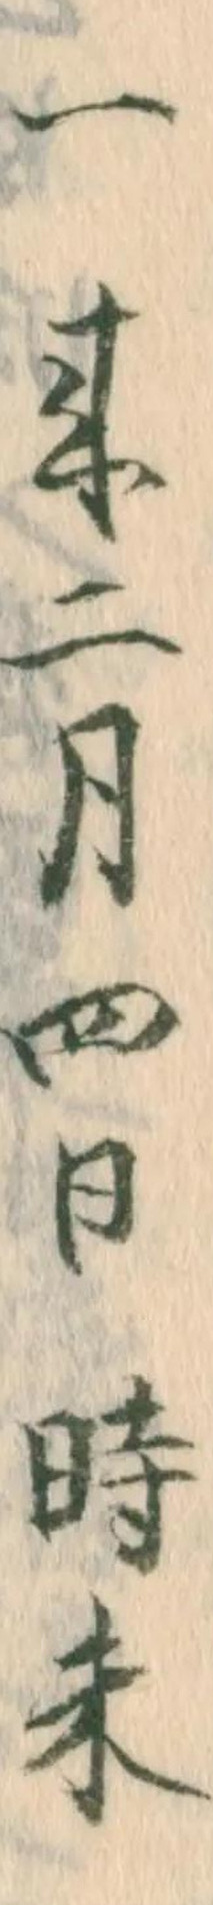一来二月四日時未
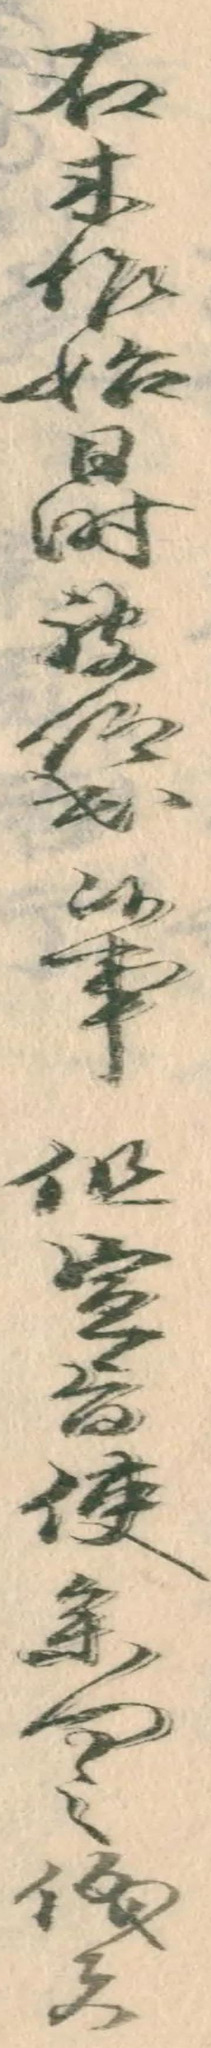右木作始日時被仰出候事但宣旨使参向之儀は
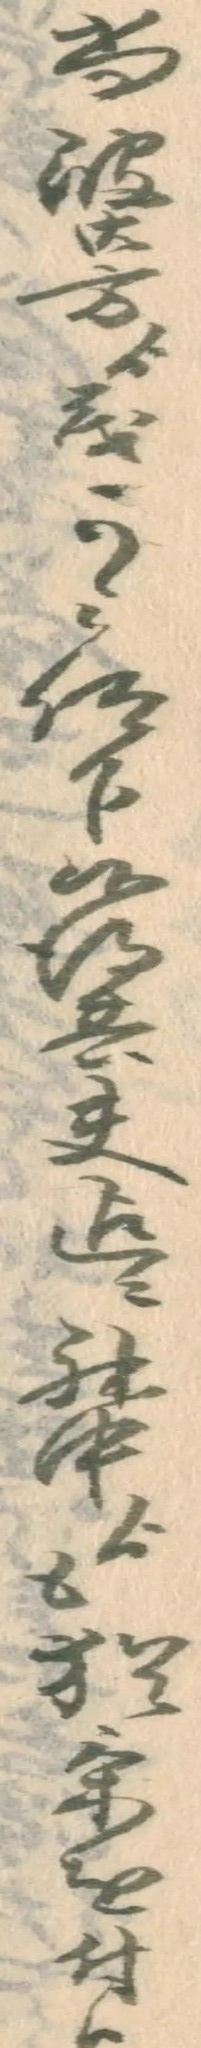当彼御方ゟ茂可被仰下候得共夫迄ニ社中ゟも猶気を付候
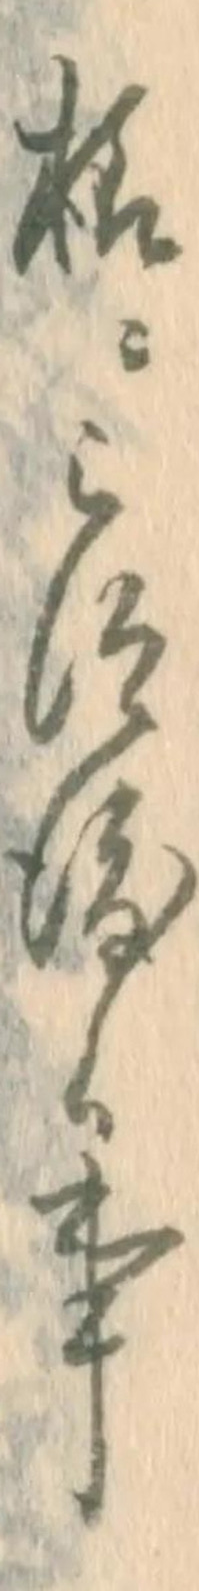様ニ被仰渡候事
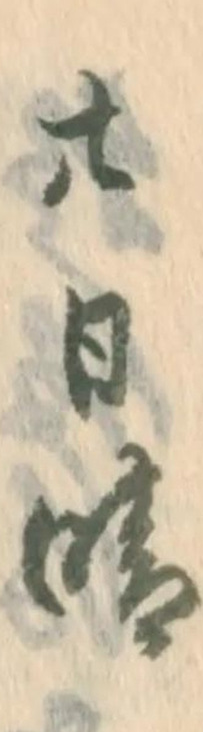廿日晴

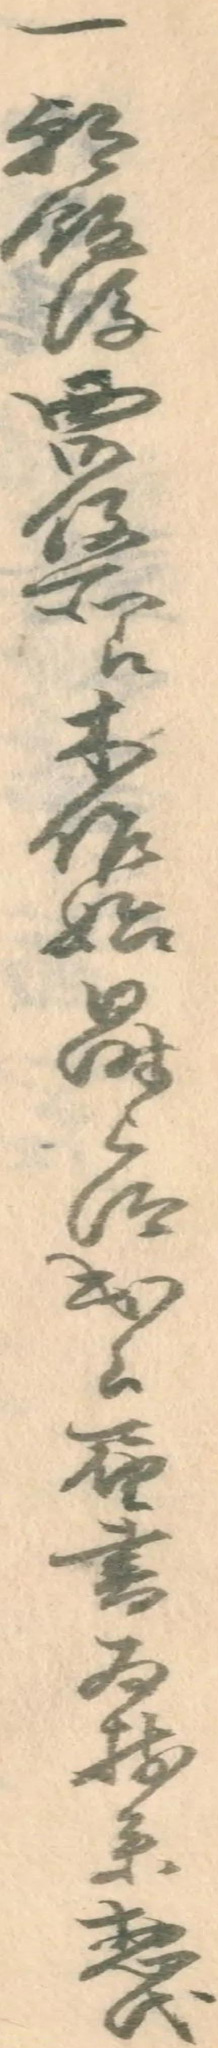一朝飯後西御役所江木作始日時被仰出候届書為持参惣代
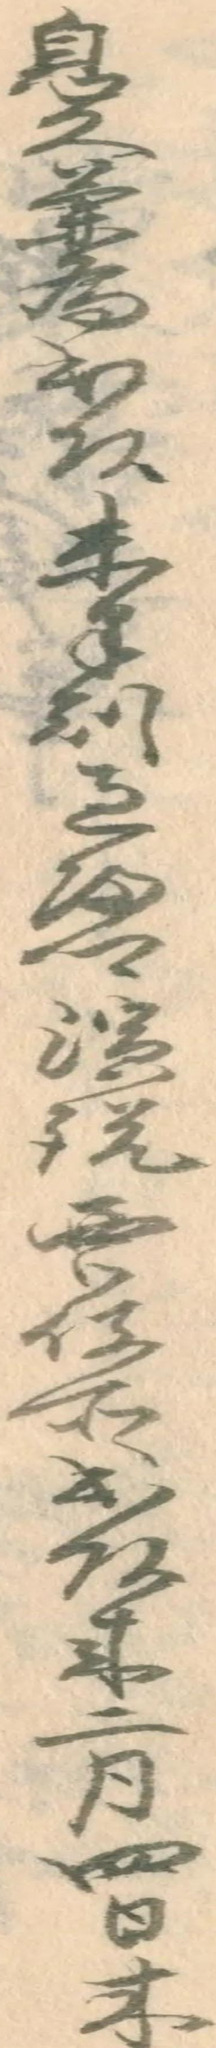息久兼為出頭未半刻過帰郷演説西御役所へ出頭来二月四日木
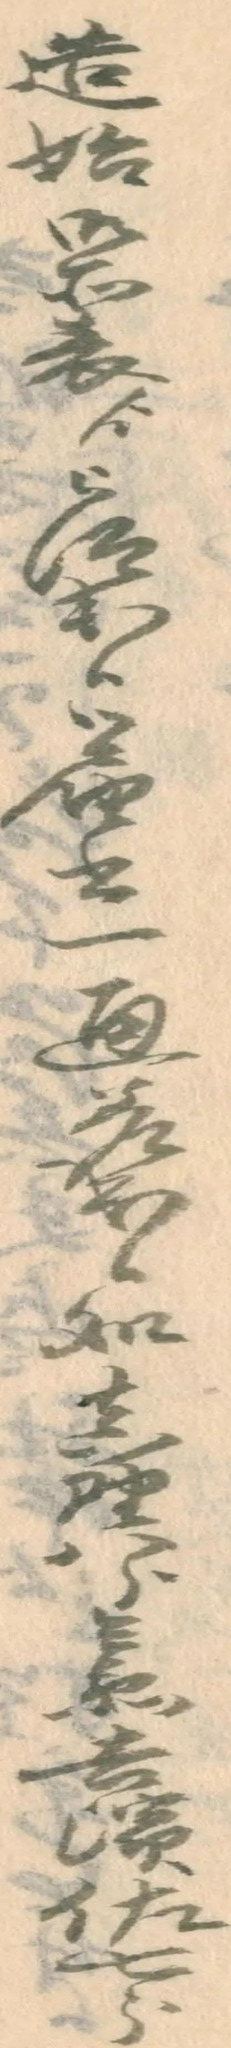造始御所表ゟ被仰出候御届書一通差出候処真野八郎兵衛吉浜佐七郎
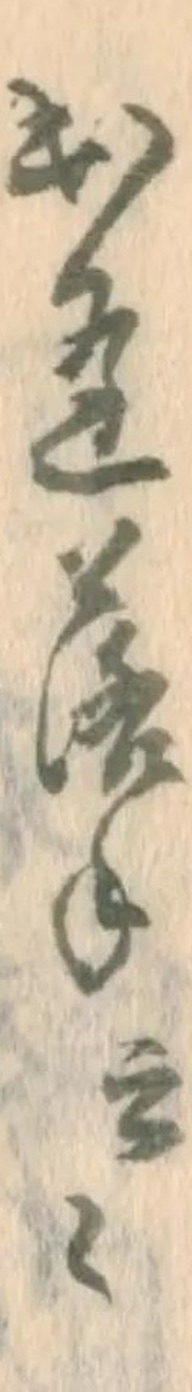出逢落手云々
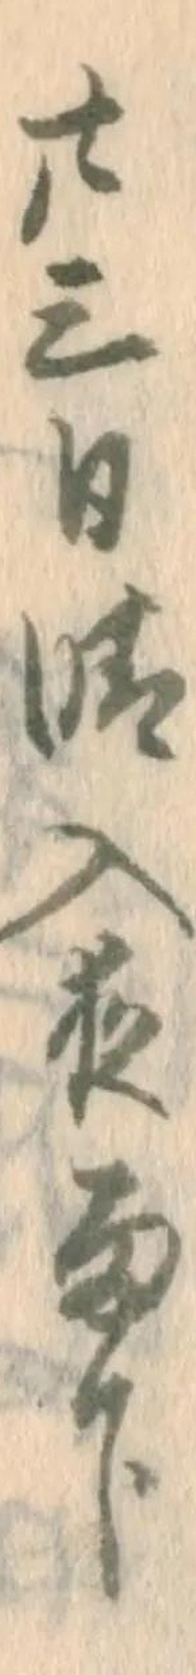廿三日晴入夜雨下
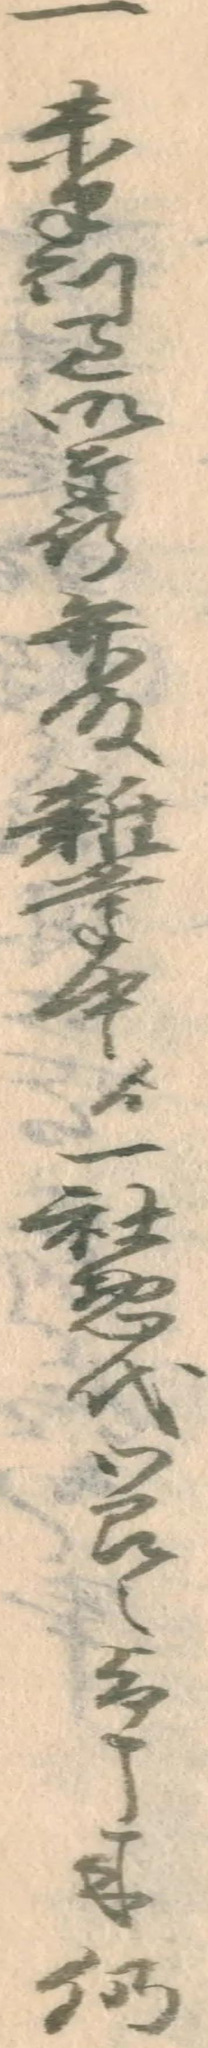一未半刻過御奉行弁殿雑掌中ゟ一社惣代御召之旨申来仍
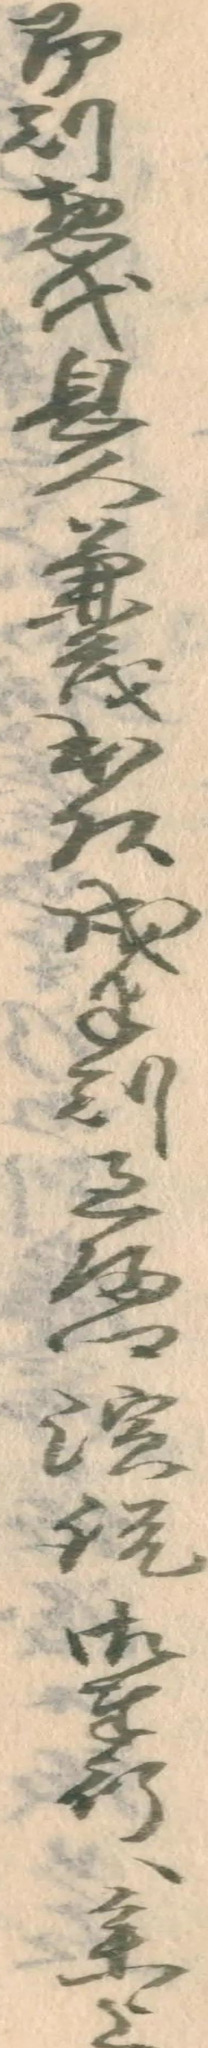即刻惣代息久兼茂出頭戌半刻過帰郷演説御奉行へ参上
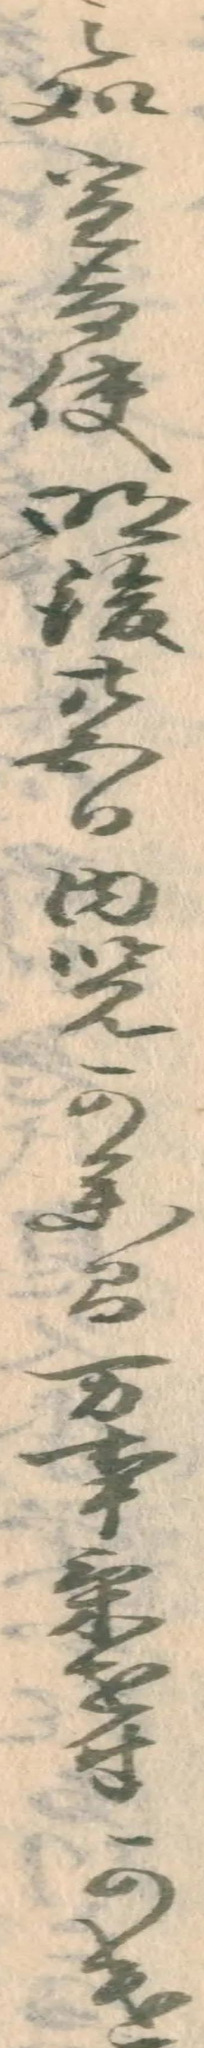之処宣旨使明後廿五日内覧可参間万事気を付可遣
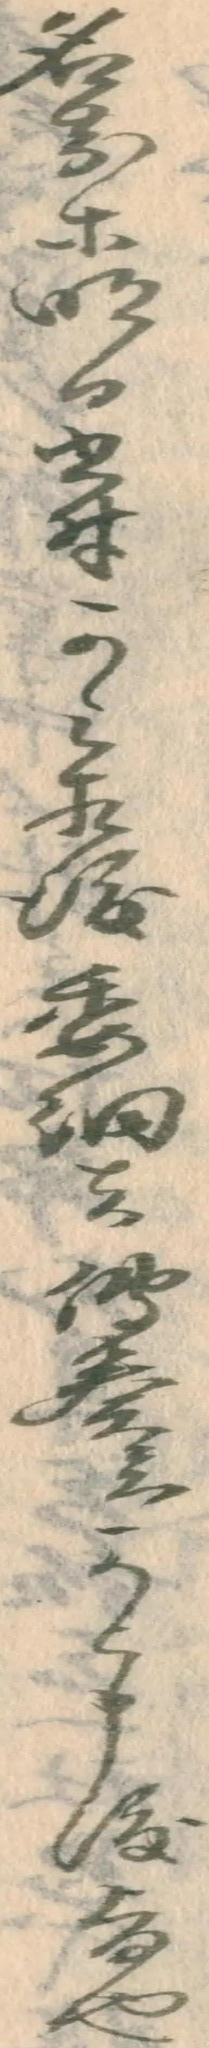名前等明日書付可被相渡委細は伝奏ニ而可被申渡旨也
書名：賀茂社記録. 第17冊
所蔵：国立国会図書館 National Diet Library, JAPAN
